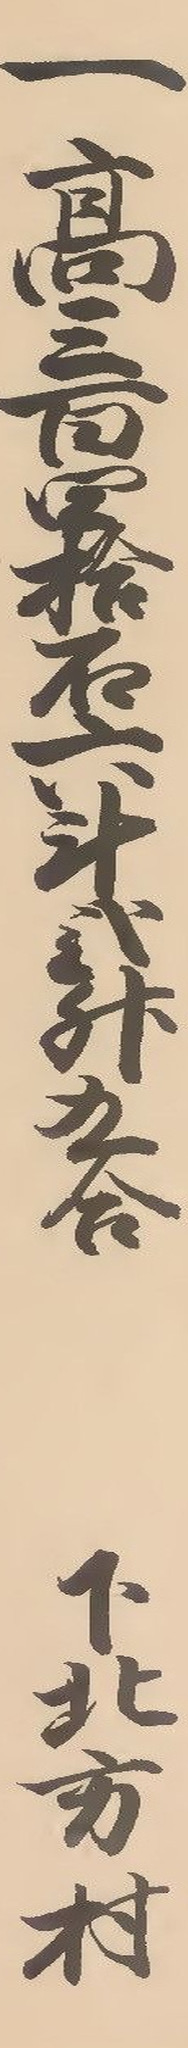一高三百四拾石六斗弐升九合下北方村
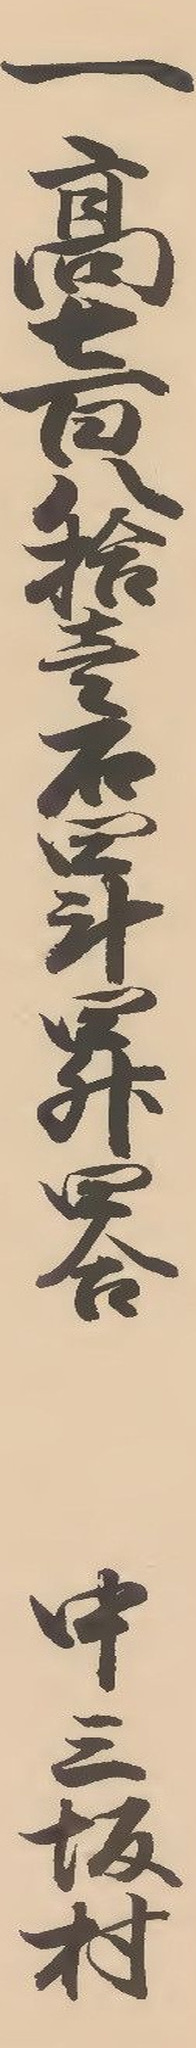一高七百八拾壱石四斗四升四合中三坂村
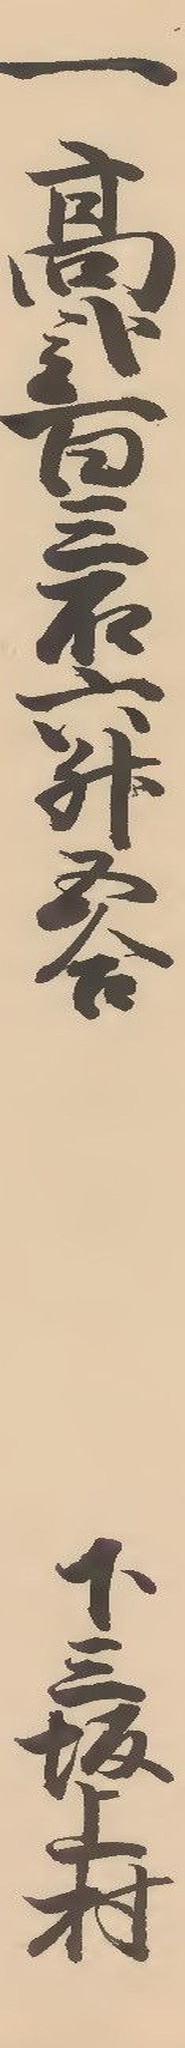一高弐百三石六升五合下三坂上村
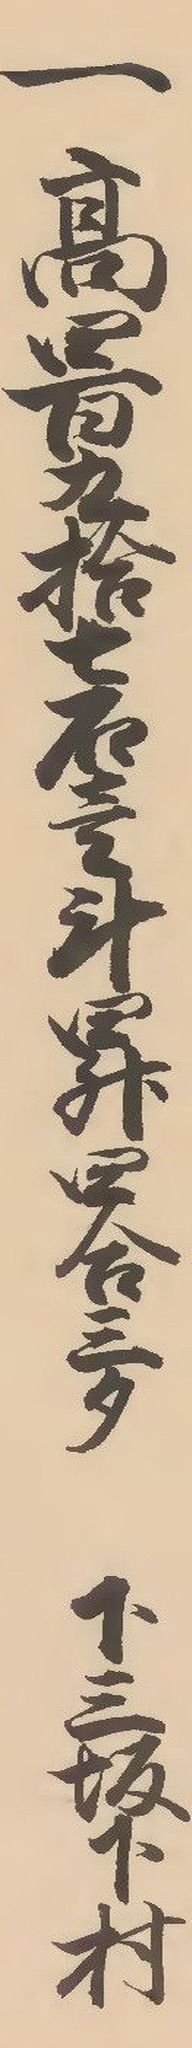一高四百九拾七石壱斗四升四合三勺下三坂下村

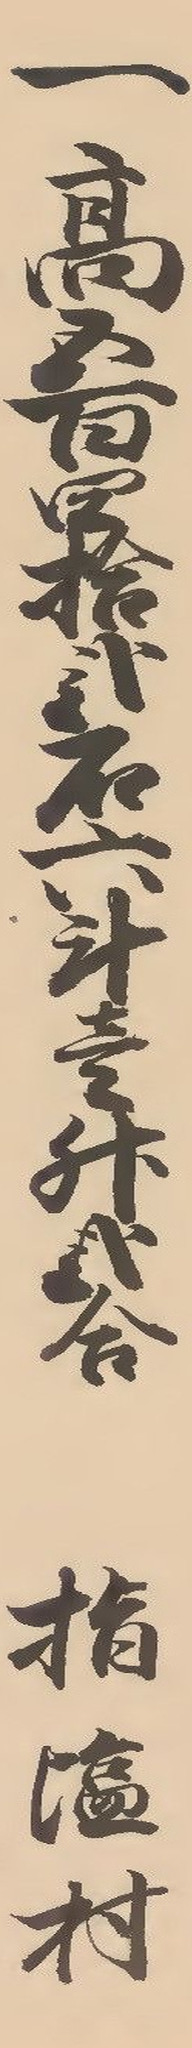一高五百四拾弐石六斗壱升弐合指塩村
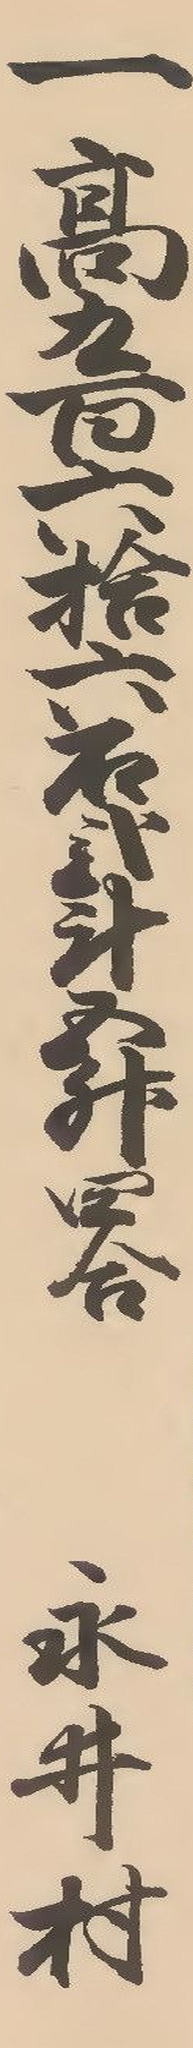一高九百六拾六石弐斗五升四合永井村
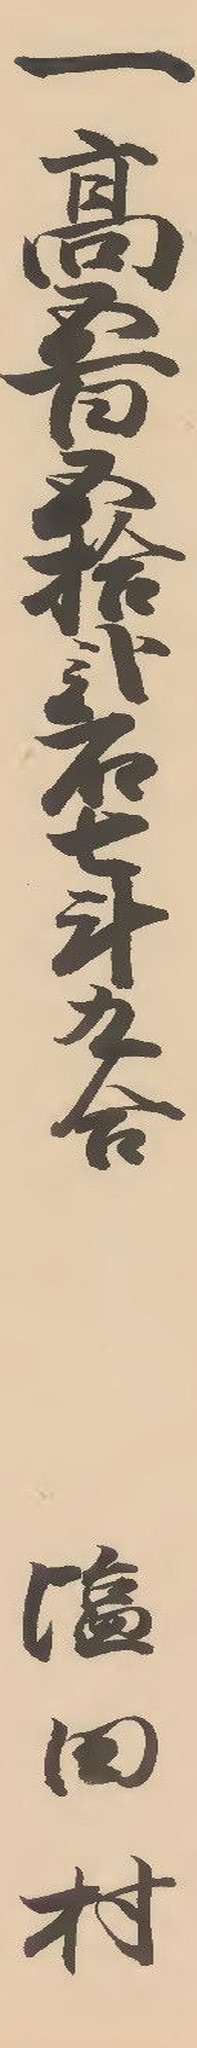一高五百五拾弐石七斗九合塩田村
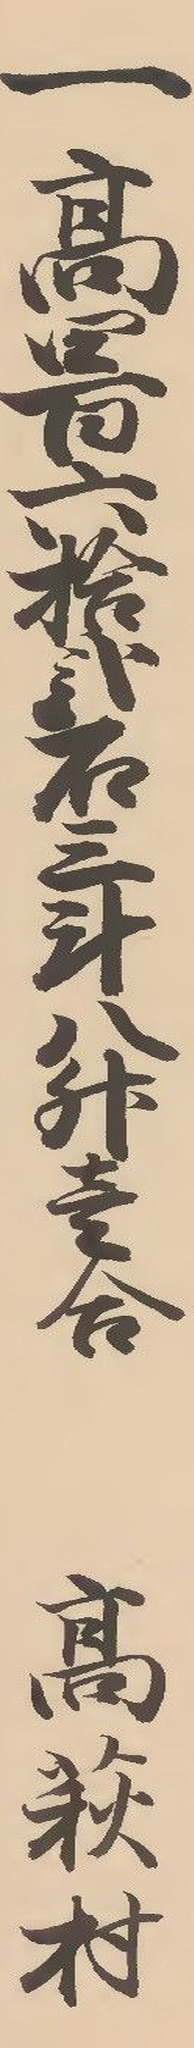一高四百六拾弐石三斗八升壱合高萩村
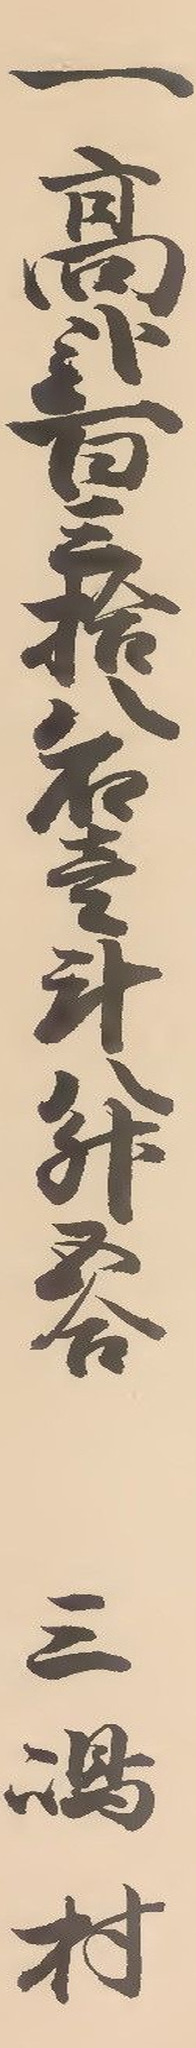一高弐百三拾八石壱斗八升五合三島村
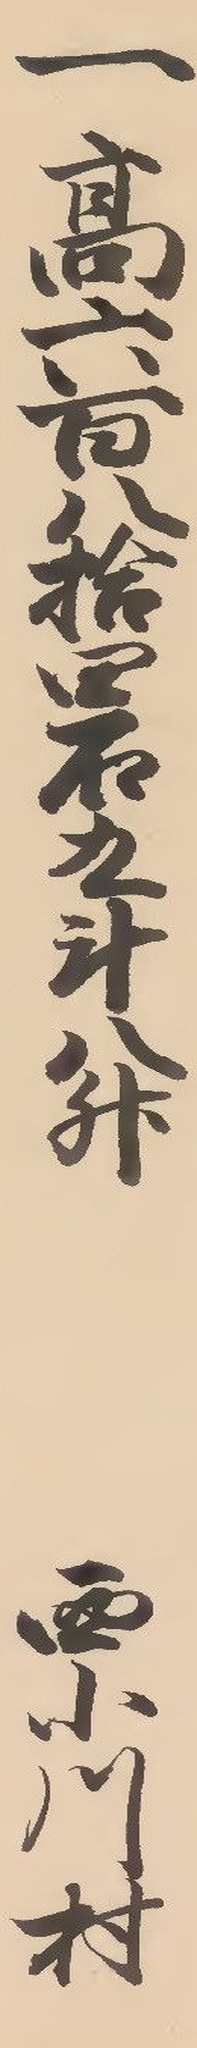一高六百八拾四石九斗八升西小川村
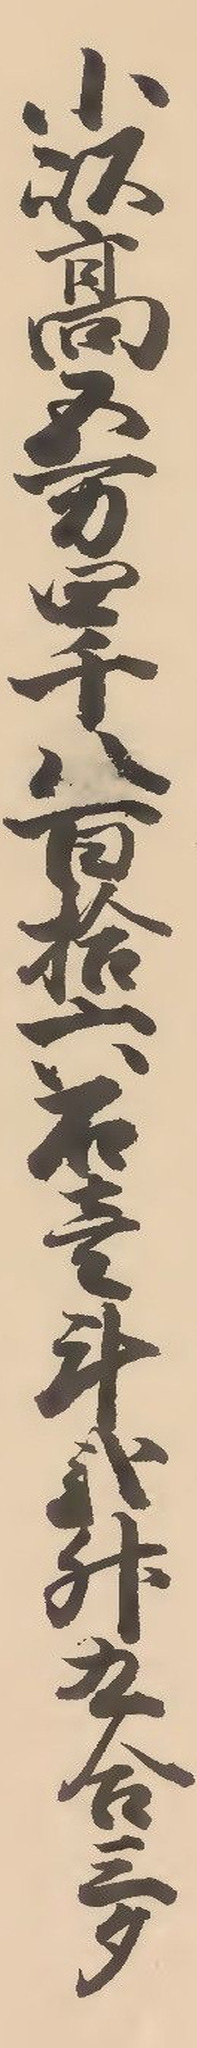小以高五万四千八百拾六石壱斗弐升九合三勺

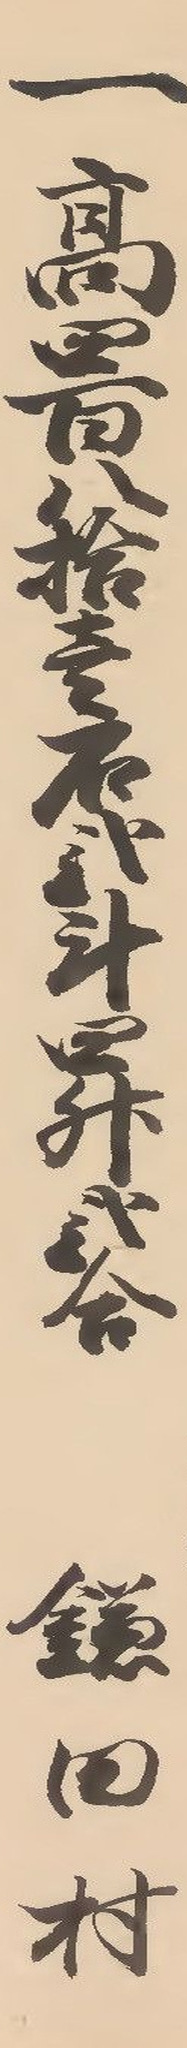一高四百八拾壱石弐斗四升弐合鎌田村
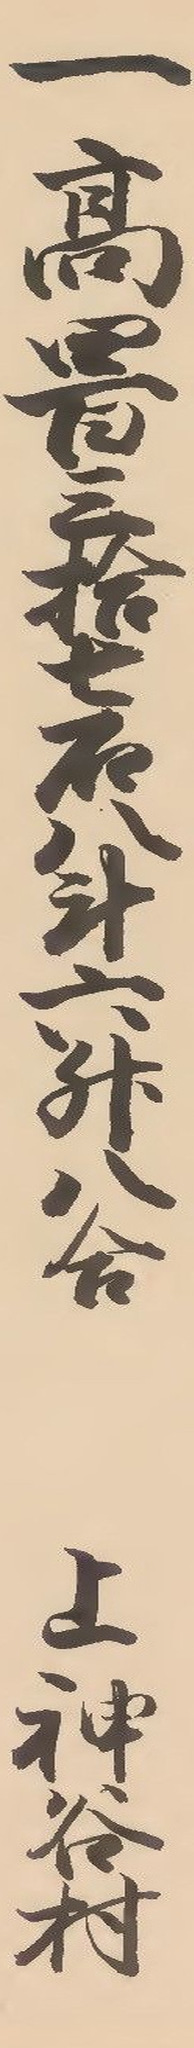一高四百三拾七石八斗六升八合上神谷村
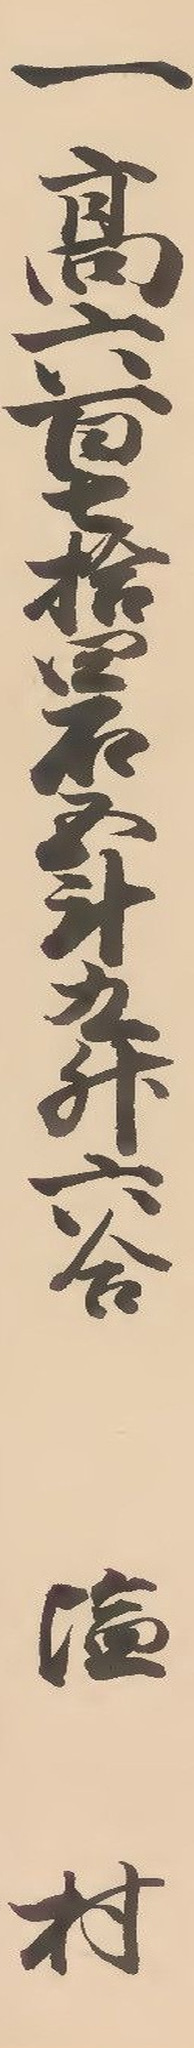一高六百七拾四石五斗九升六合塩村
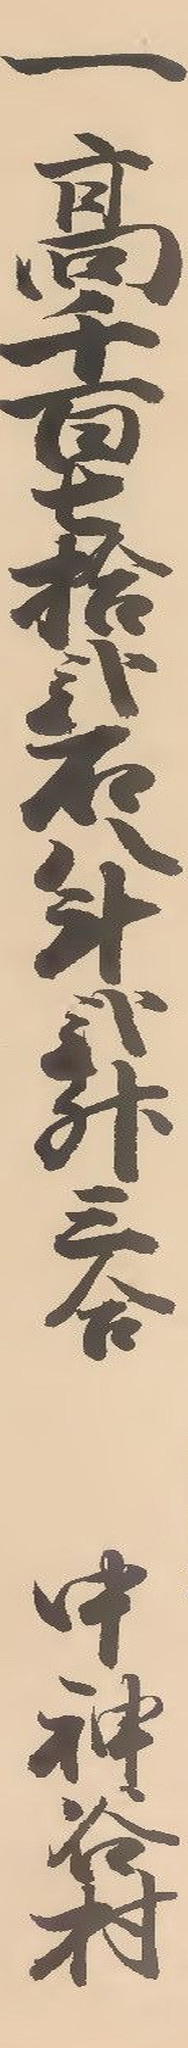一高千百七拾弐石八斗弐升三合中神谷村
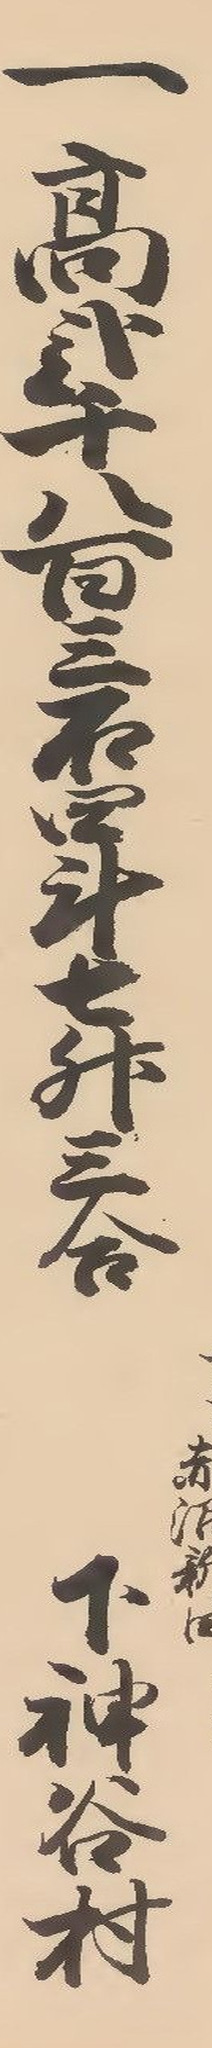一高弐千八百三石四斗七升三合下神谷村
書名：陸奥国郷帳　３
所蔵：国立公文書館 National Archives of Japan
